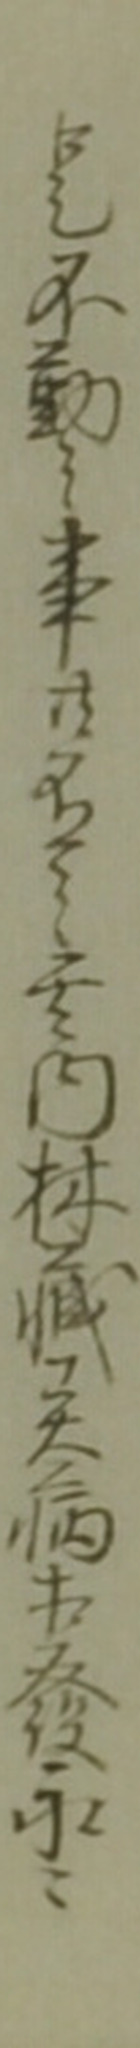是不勤之事共有之其内林蔵異病相発永々
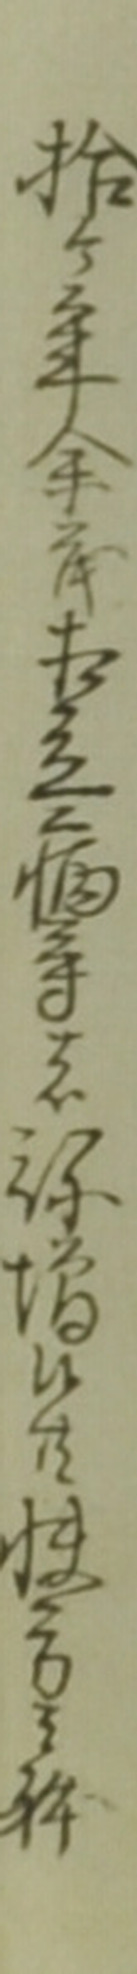拾ヶ年余茂相立病気者弥増候共快方之躰
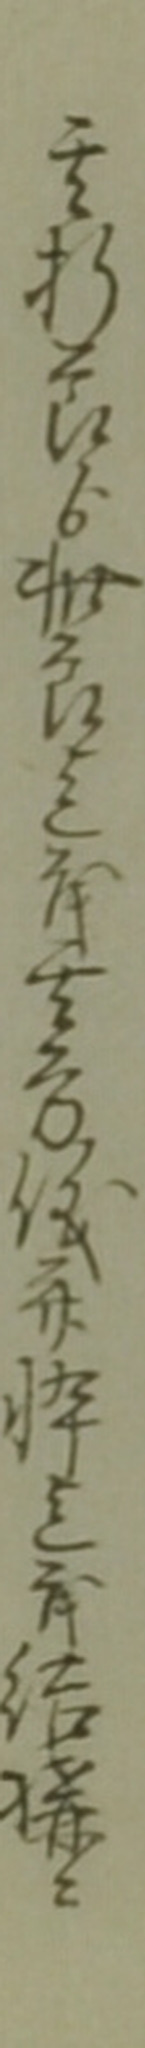其折節ゟ此節迄茂其方儀弁忰迄茂結構ニ
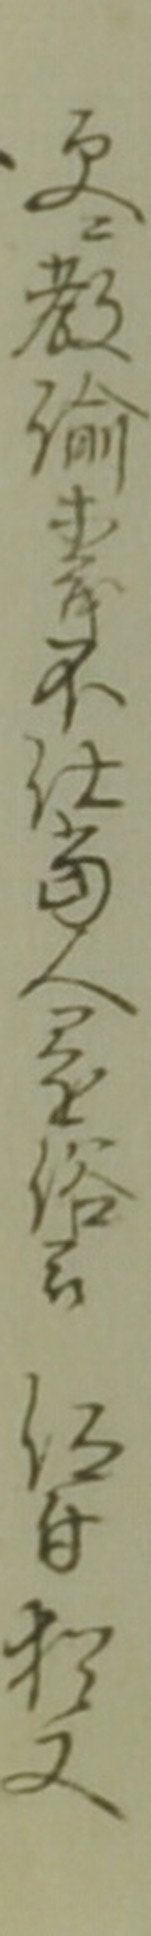更ニ教諭等茂不仕当人還俗被仰付猶又
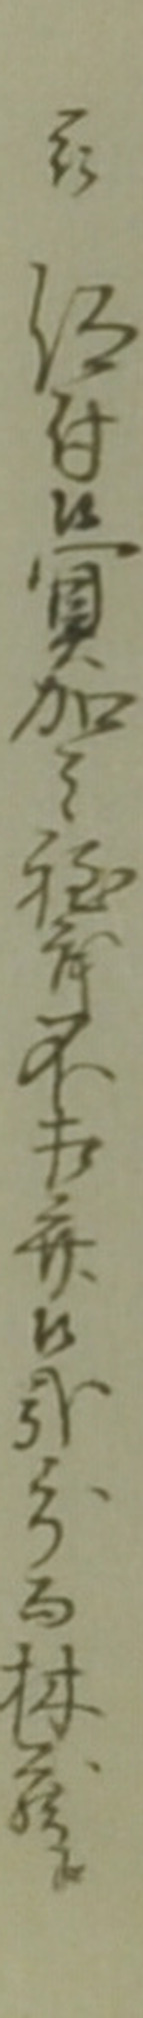被仰付候冥加之程茂不相弁候哉分而林蔵江

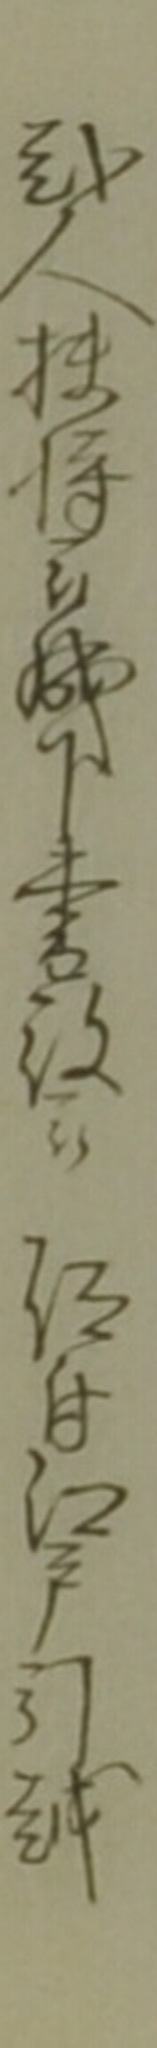弐人扶持被成下書役被仰付江戸引越
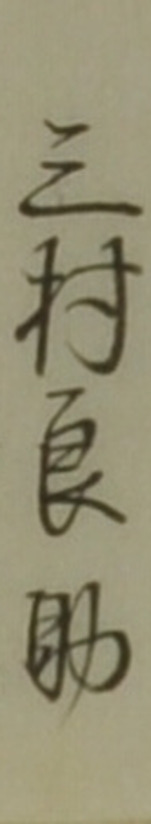三村良助
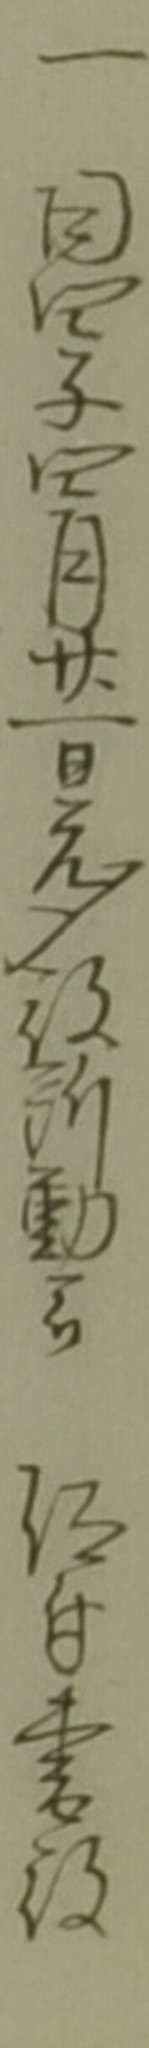一同四子四月廿一日元〆役所勤被仰付書役
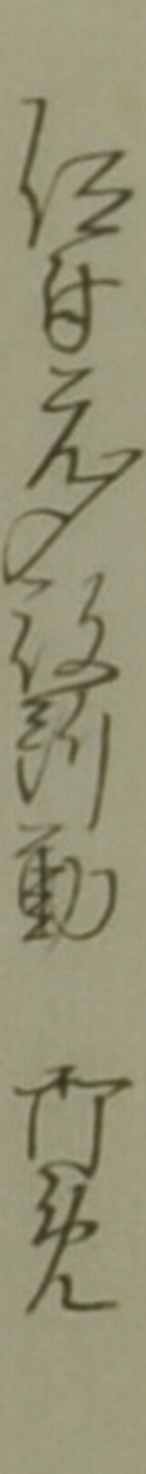仰付元〆役所勤御免
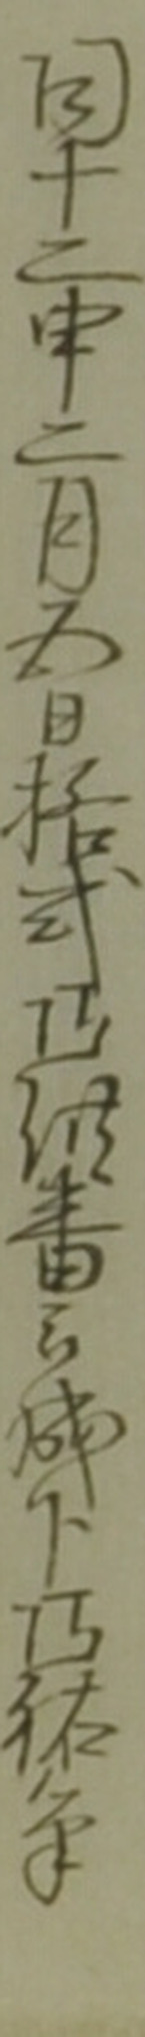一同十二申二月五日格式御供番被成下御祐筆
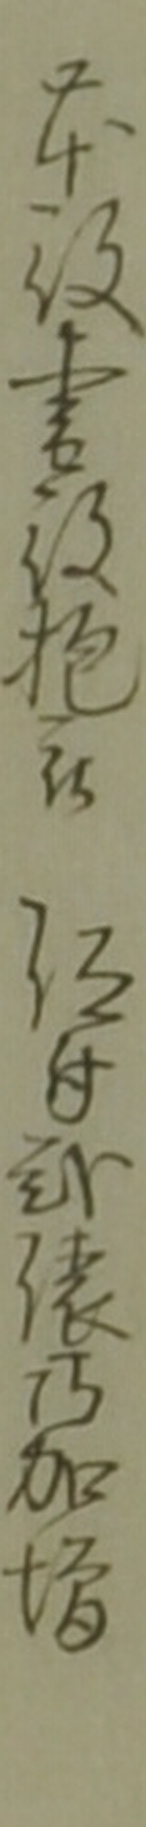本役書役抱被仰付弐俵御加増
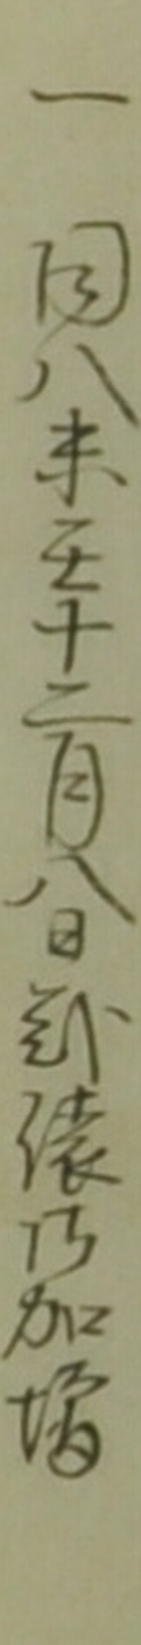一同八未閏十二月八日弐俵御加増
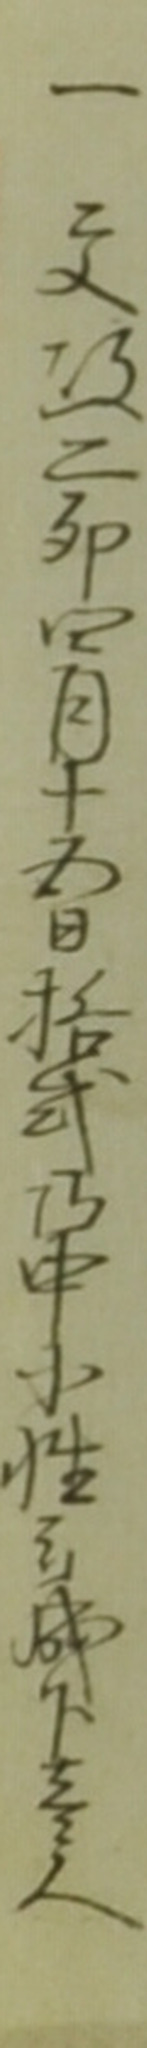一文政二卯四月十五日格式御中小性被成下壱人

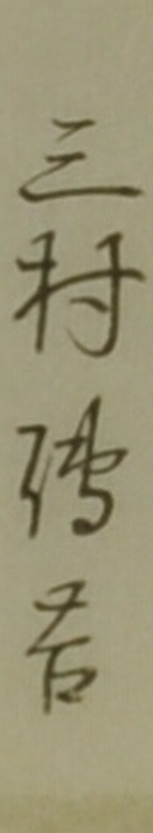三村伝吉

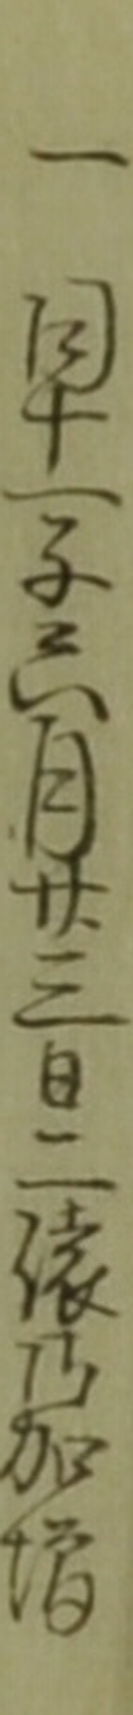一同十一子六月廿三日二俵御加増
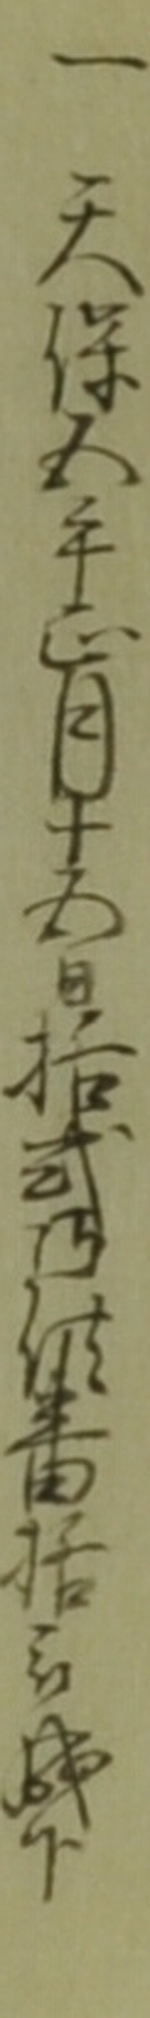一天保五午正月十五日格式御供番格被成下
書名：無足諸士勤仕録（一）
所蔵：伊那市立高遠町図書館・合同会社AMANE
